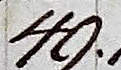49
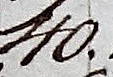40
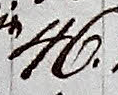46
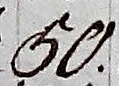50
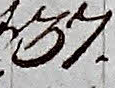37
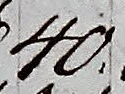40
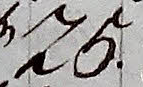25
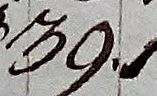39
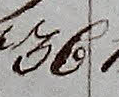36
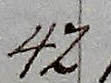42
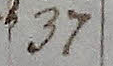37
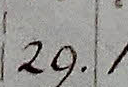29.
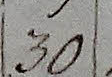30
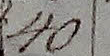40
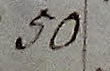50
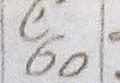60
